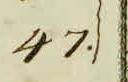47.
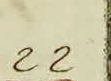22
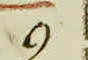9
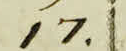17.
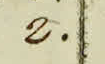2.
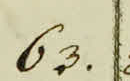63.
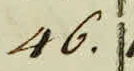46.
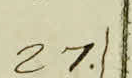27.
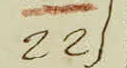22
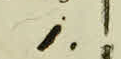1.
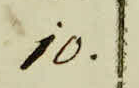10.
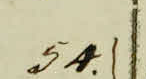54.
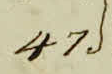47
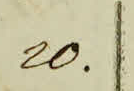20.
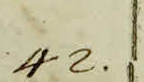42.
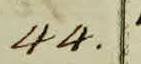44.
